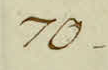70
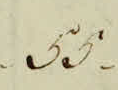55
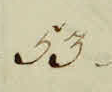53
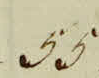55
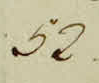52
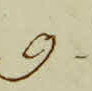9
